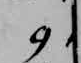9
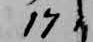17
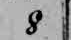8
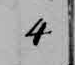4
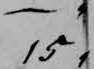15
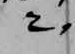2
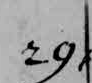29
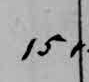15
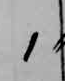1
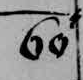60
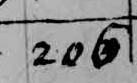206
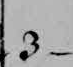3
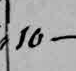10
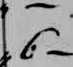6
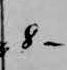8
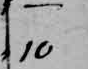10
